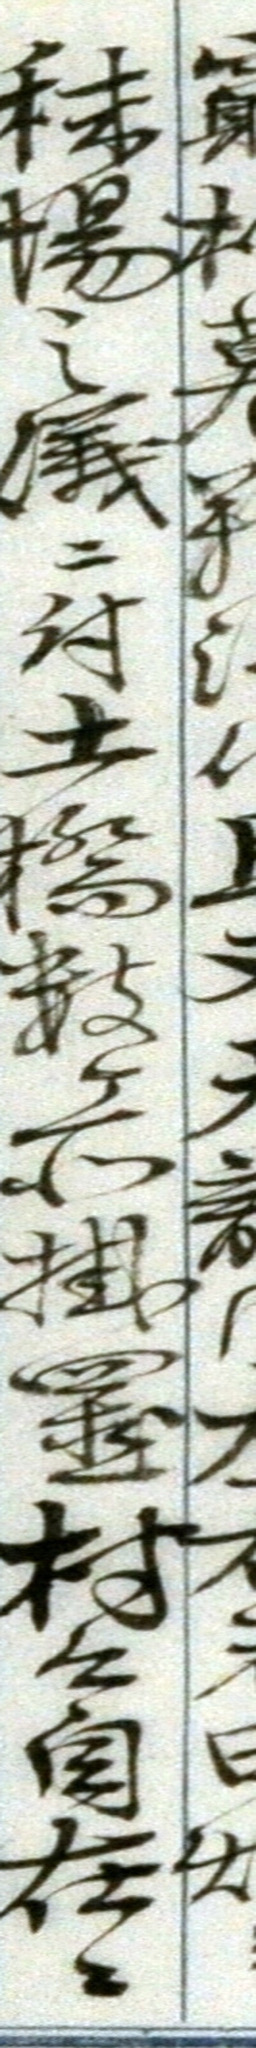秣場之儀二付土橋数ケ所掛置村々自在候
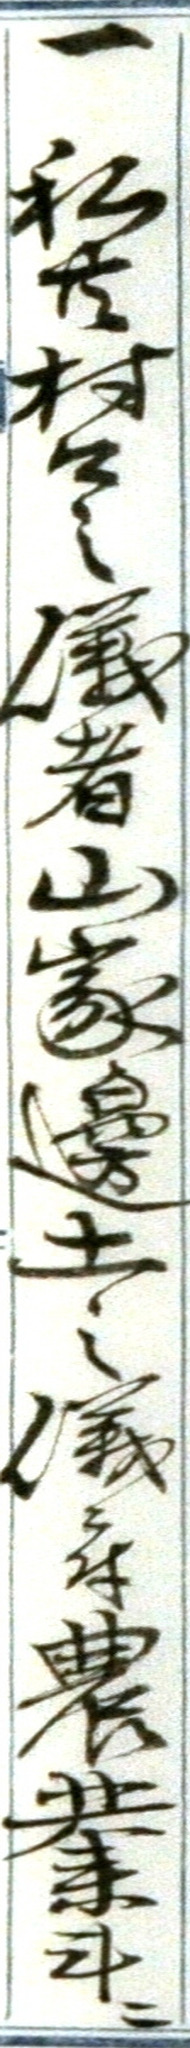一私共村々之儀者山家邊土之儀二付農業斗ニ
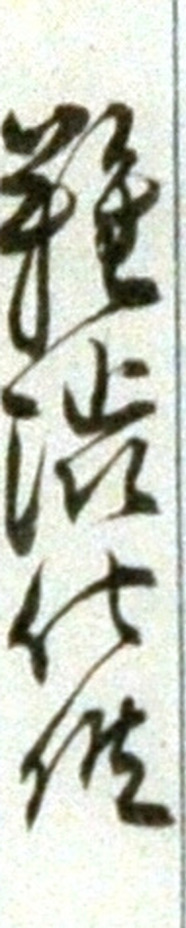難渋仕候

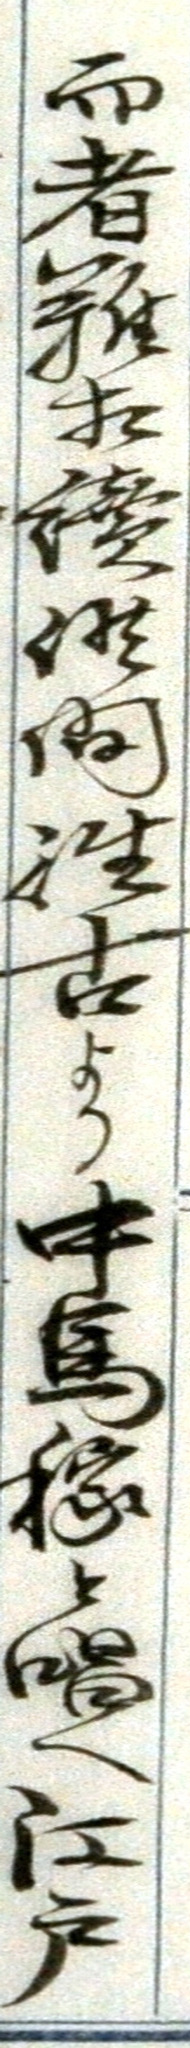而者難相続候間往古より中馬稼と唱へ江戸
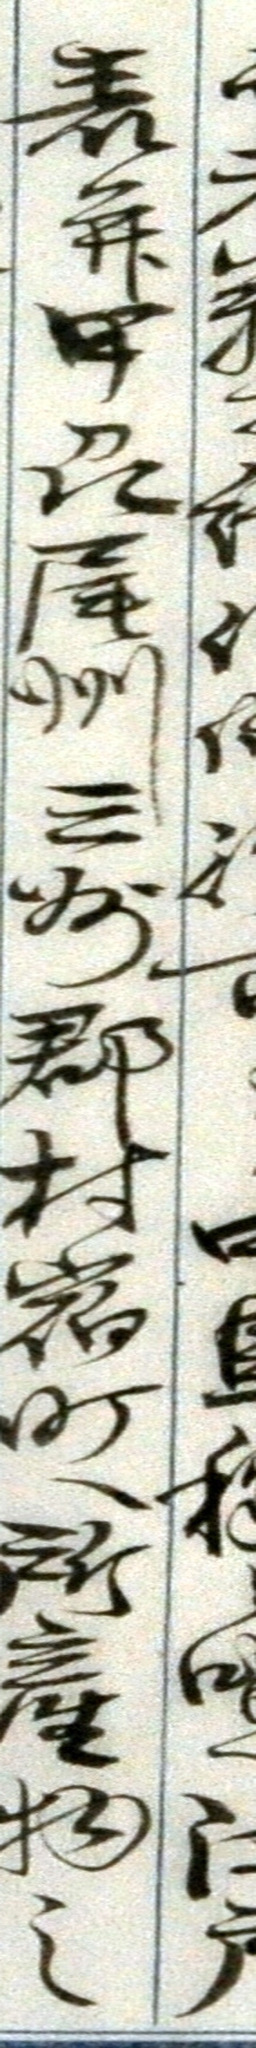表并甲州尾州三河郡村宿町へ所産物之
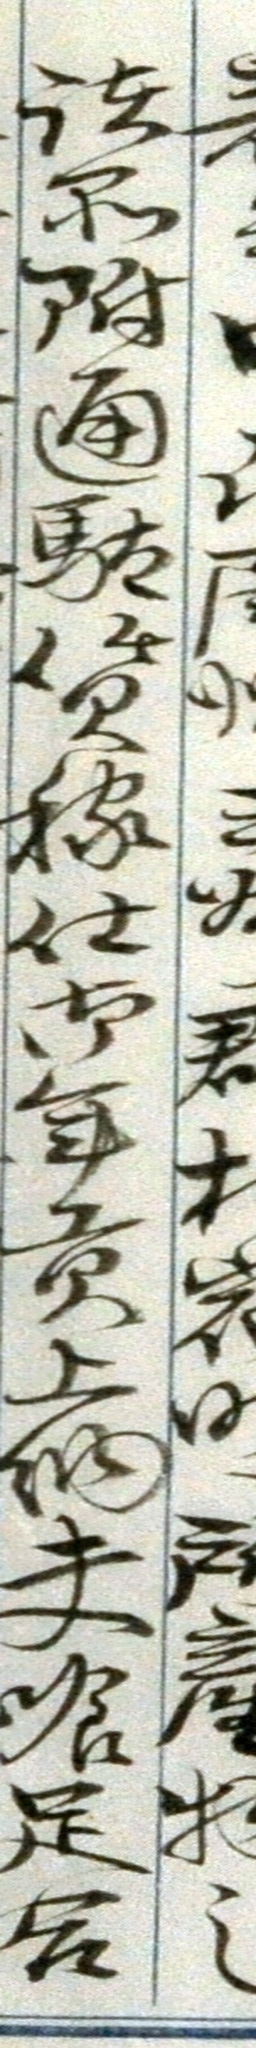緒品附通駄賃稼仕御年貢上納夫喰足合
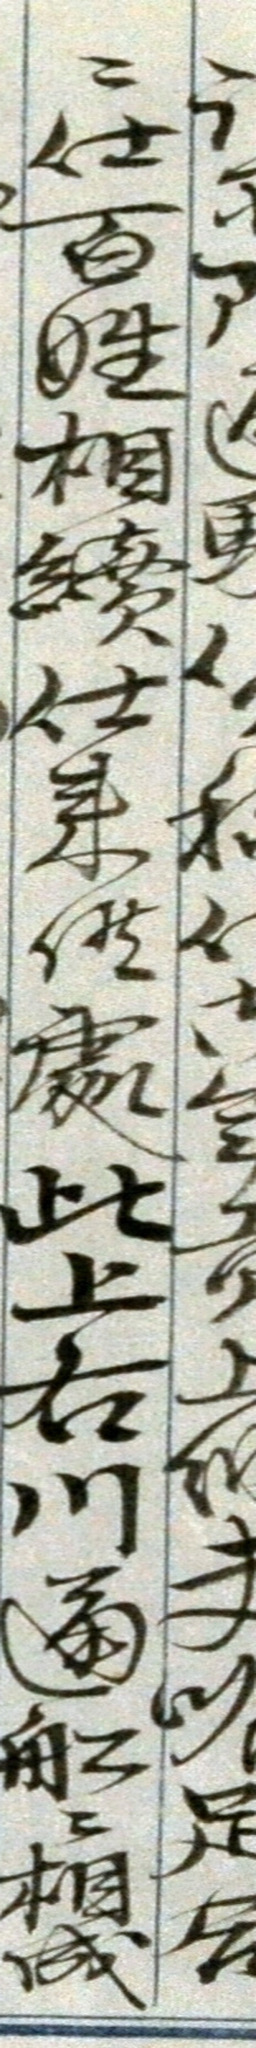ニ仕百姓相続仕来候處此上右川通船ニ相成
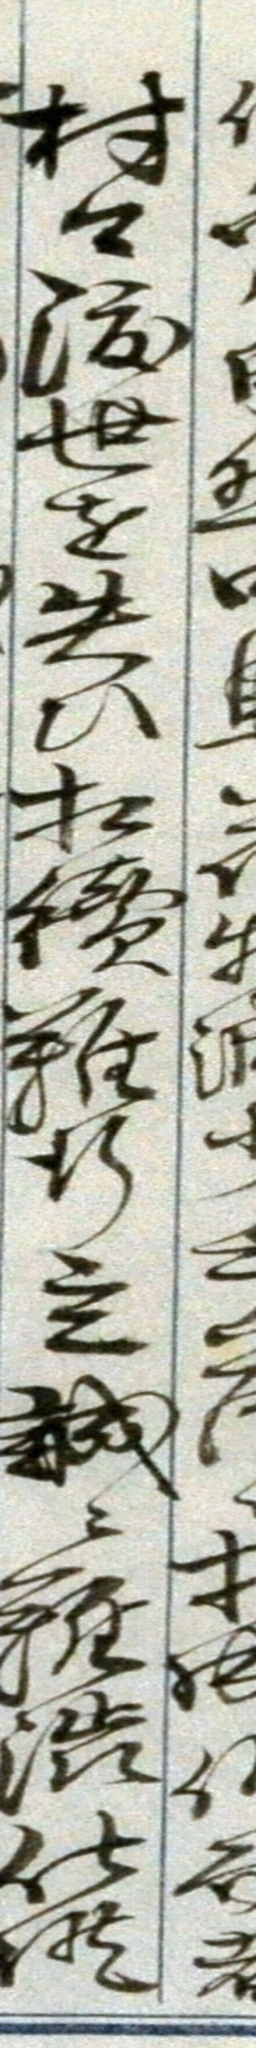村々渡世を失ひ相続難行主誠ニ難渋仕候
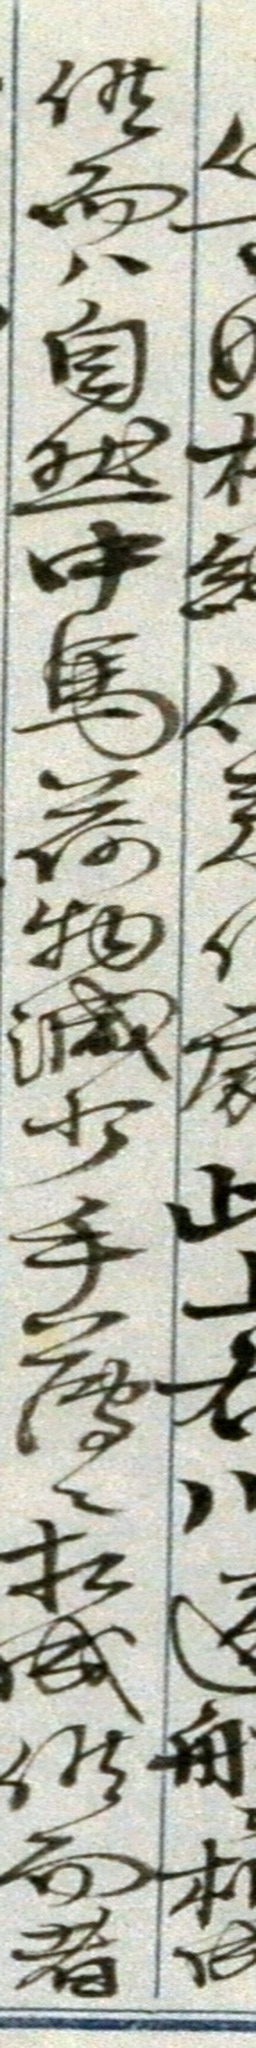候而ハ自然中馬荷物減少手薄ニ相成候而者
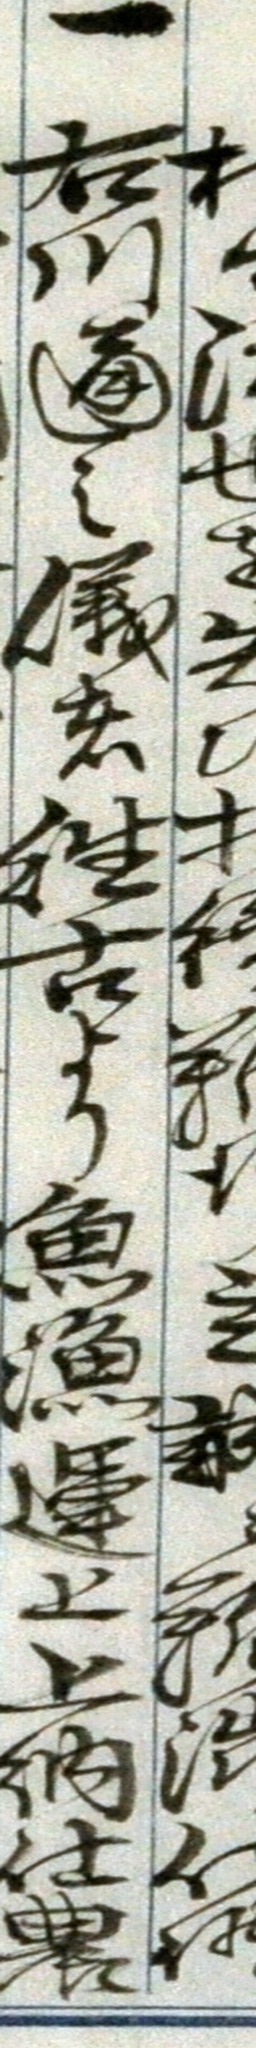一右川通之儀者往古より魚漁運上上納仕農
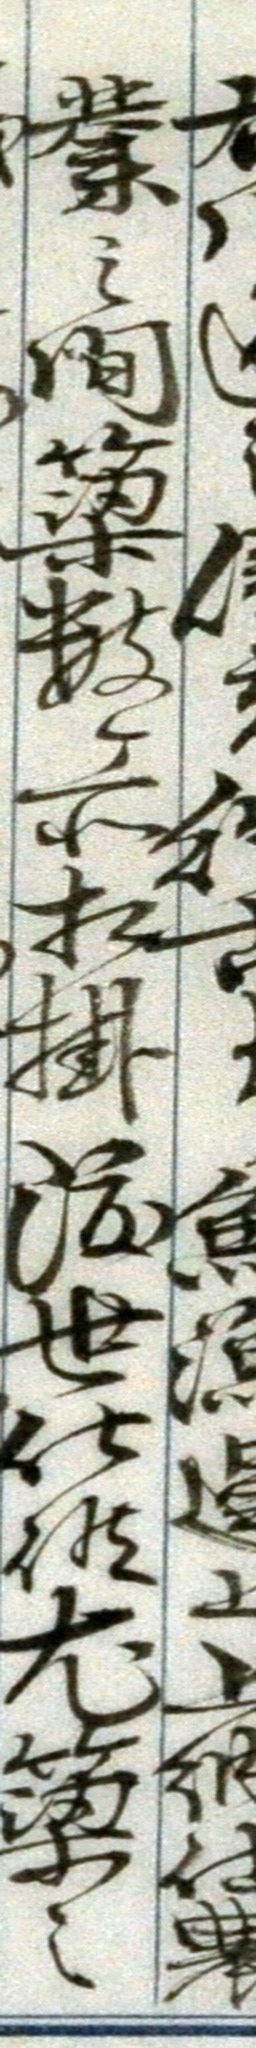業之間簗数ヶ所相掛渡世仕候尤簗之
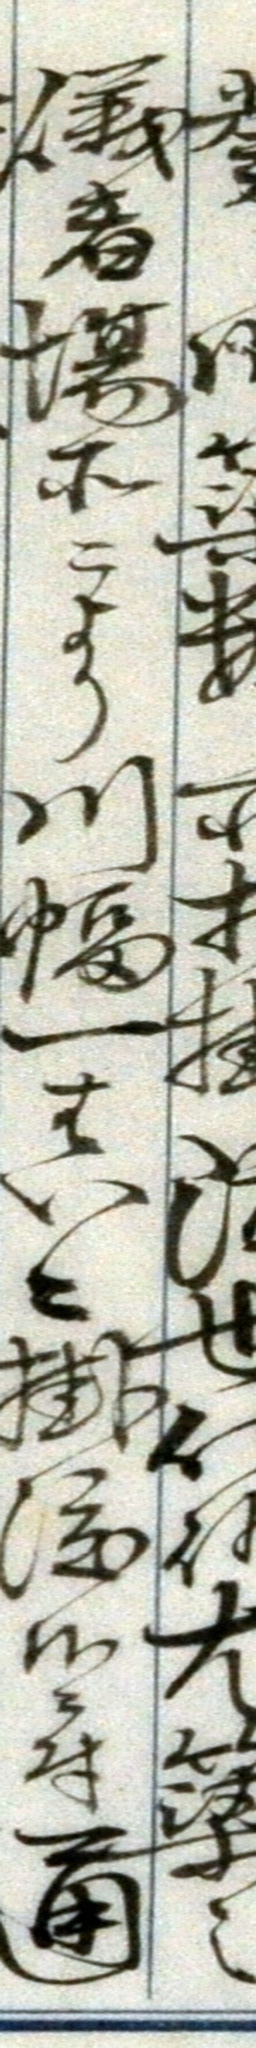儀者場所により川幅一はいと掛浅候ニ付通
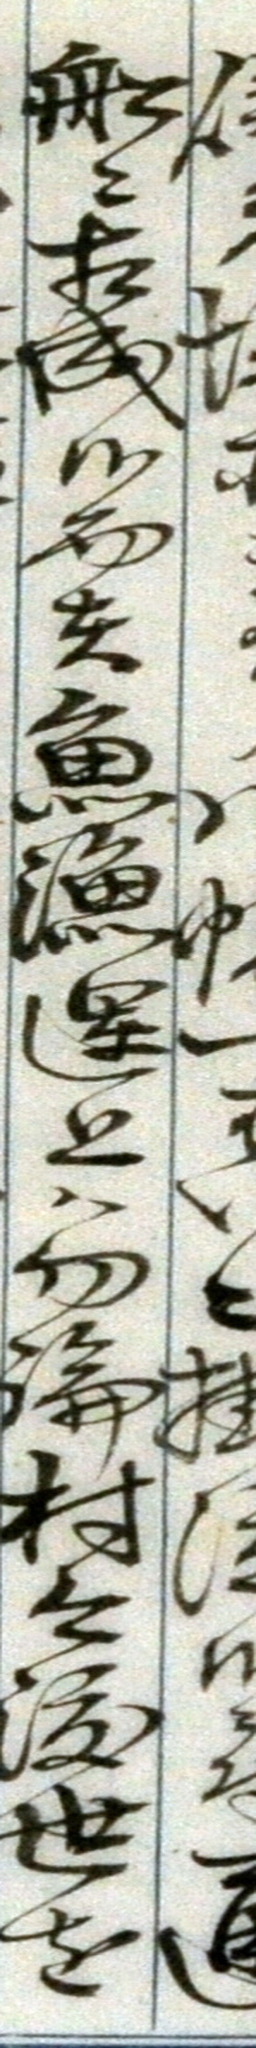船ニ相成候而者魚漁運上ハ勿論村々渡世を
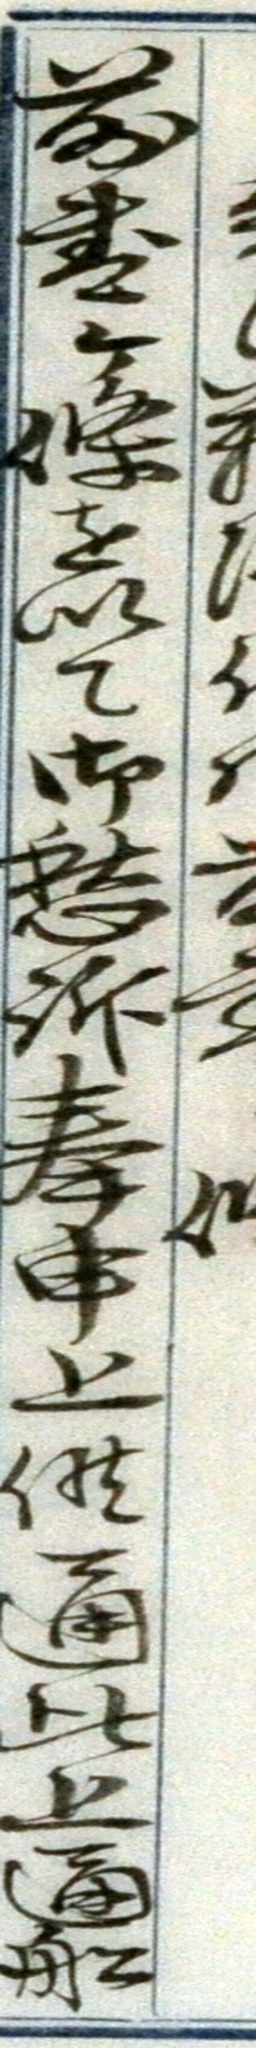前書ヶ條を以て御愁訴奉申上候通此上通船
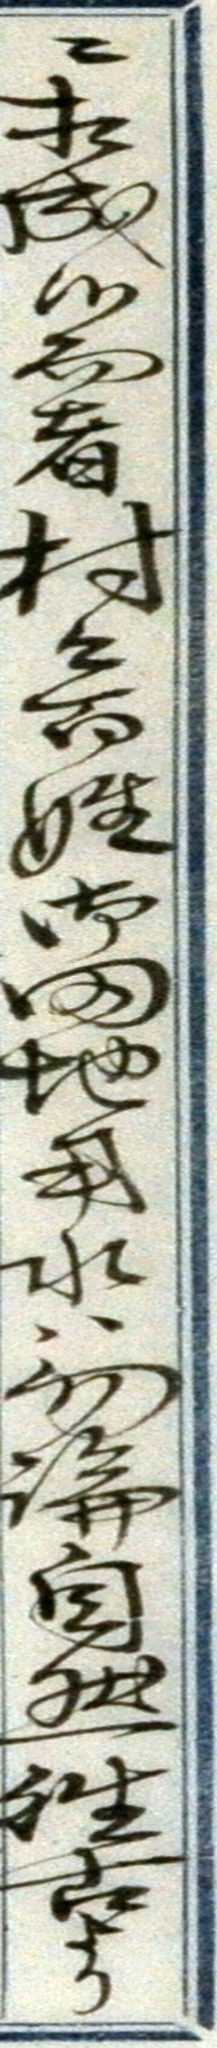ニ相成候而者村々百姓御田地用水ハ勿論自然往古より
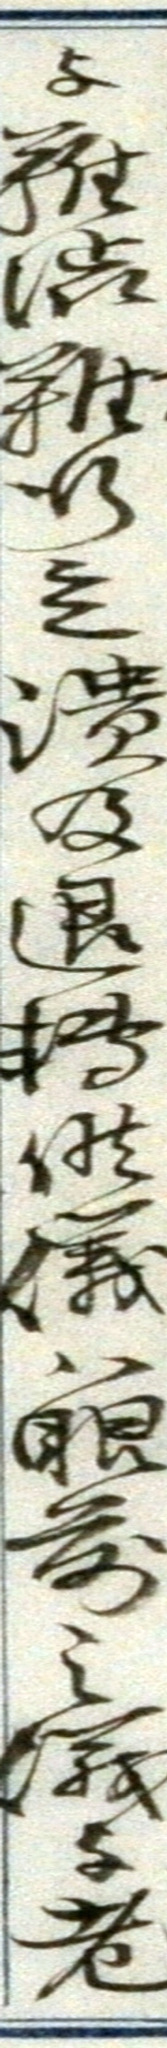と難渋難行主潰及退転候儀ハ眼前之儀と老
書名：天竜川通船難渋願并取極書
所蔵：伊那市立高遠町図書館・合同会社AMANE
